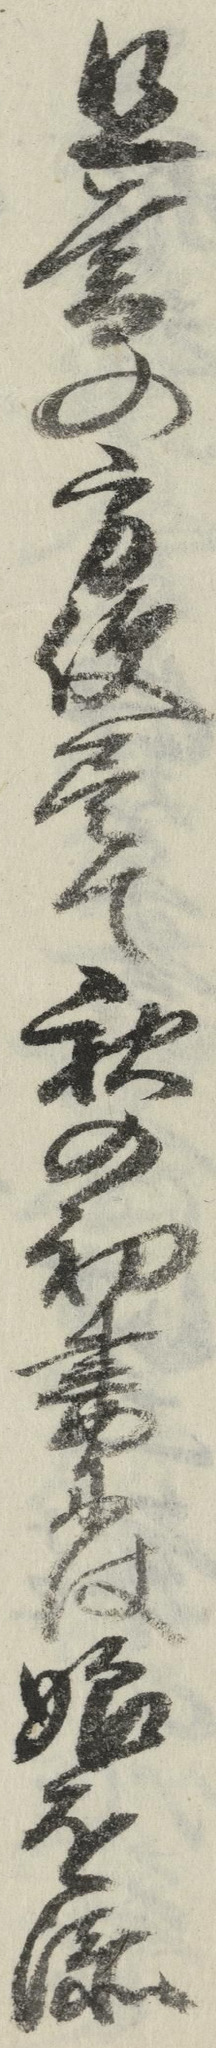且暮の方便尽て秋の初妻には娘を添
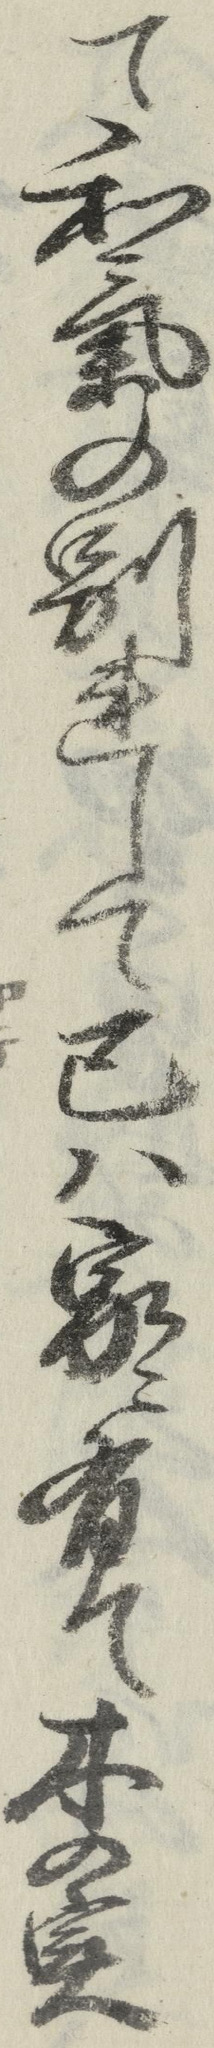て和気の別れして己は家に有て木の実
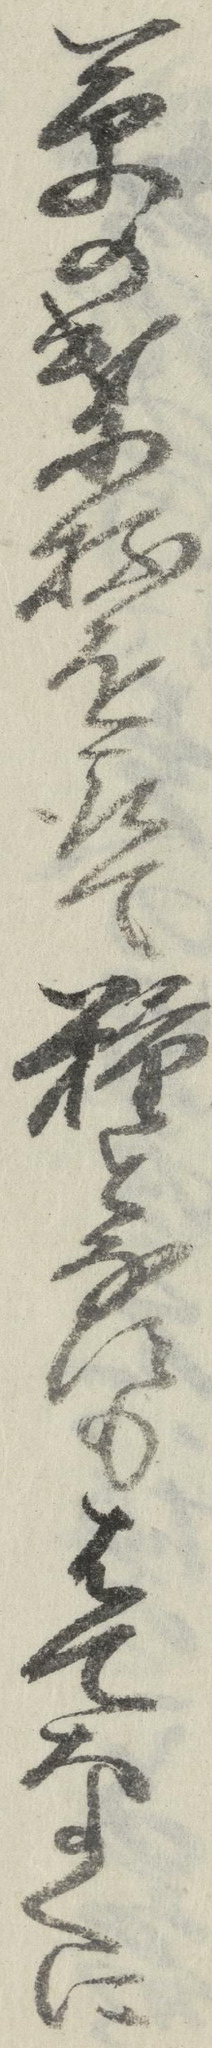草の葉抔を取て糧となすもはてなくに
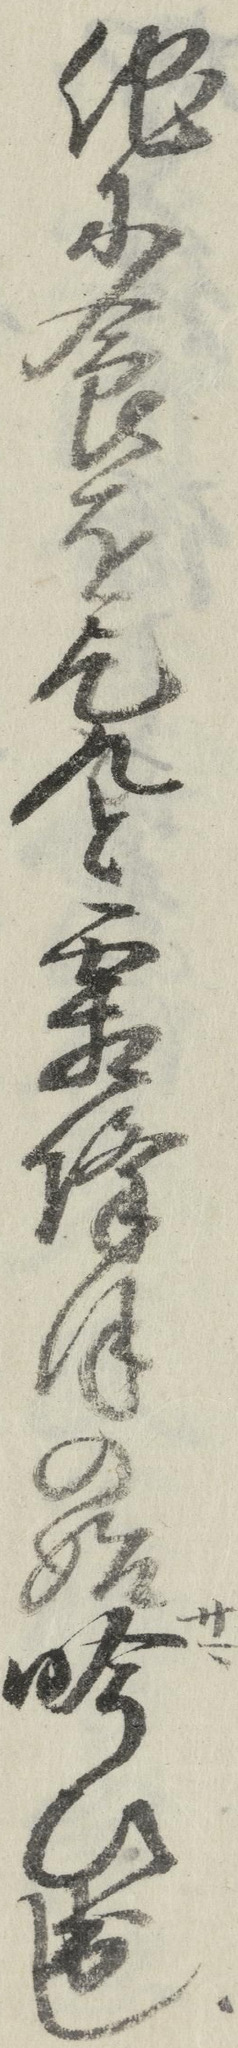他に食を乞んと霜降月の始-吟ひ出し
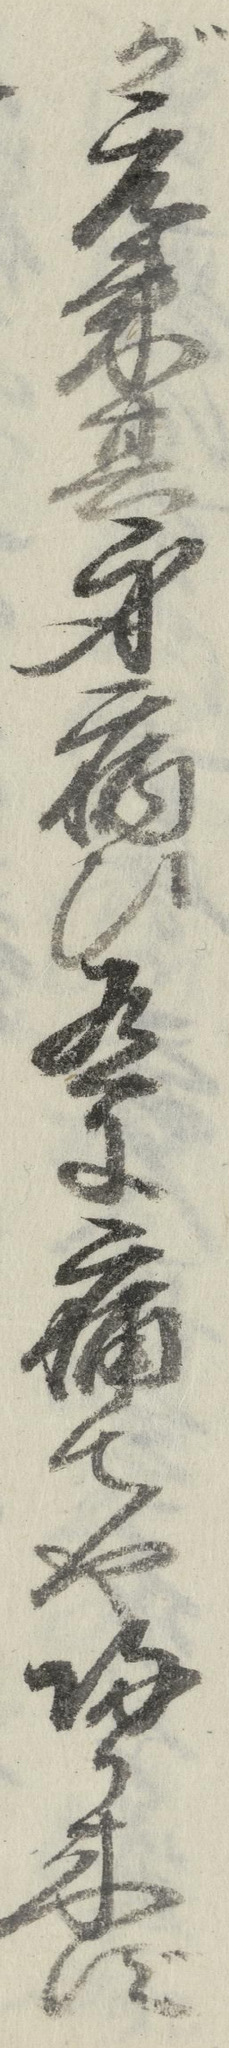が元来其身病ひ有に痛てや帰り来ず
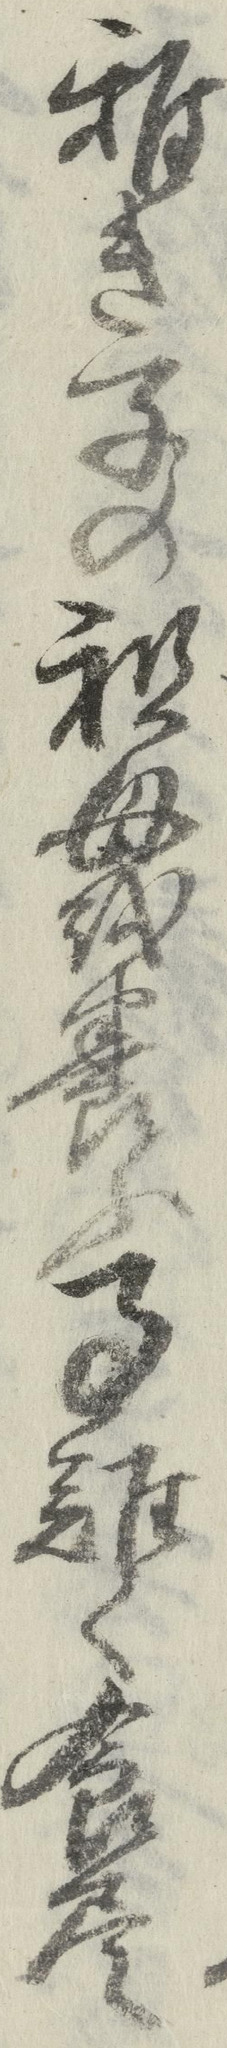稚き子の祖母を養ふ事難く食尽
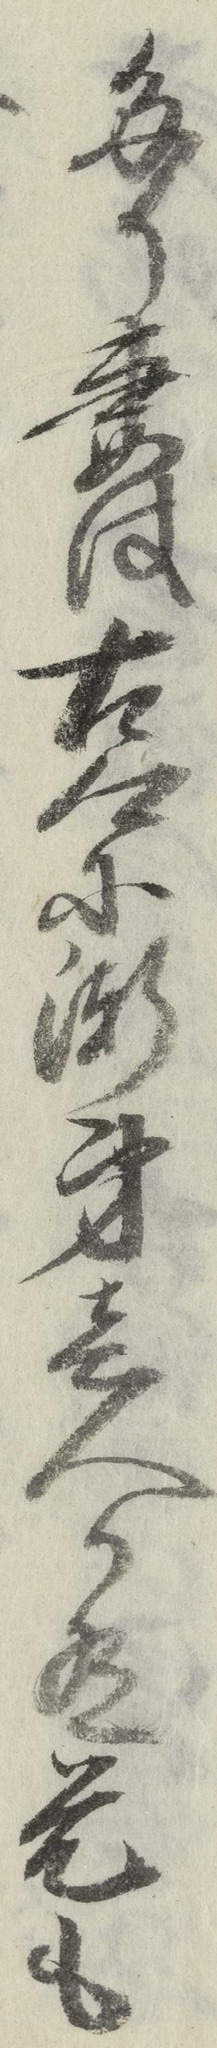たり妻は古郷に漸弟壱人り有是も
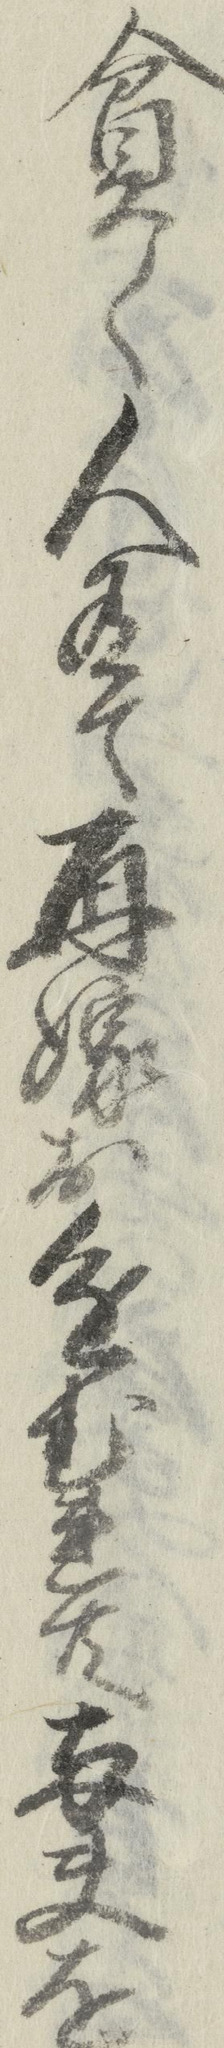貧く人有て再嫁お進むれ共両夫を
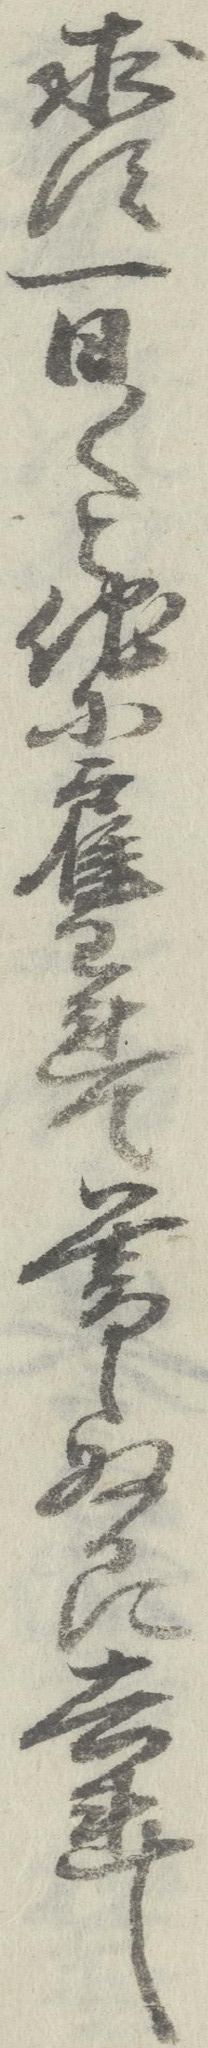求す一日〳〵と他に雇われて暮しぬるに去れし
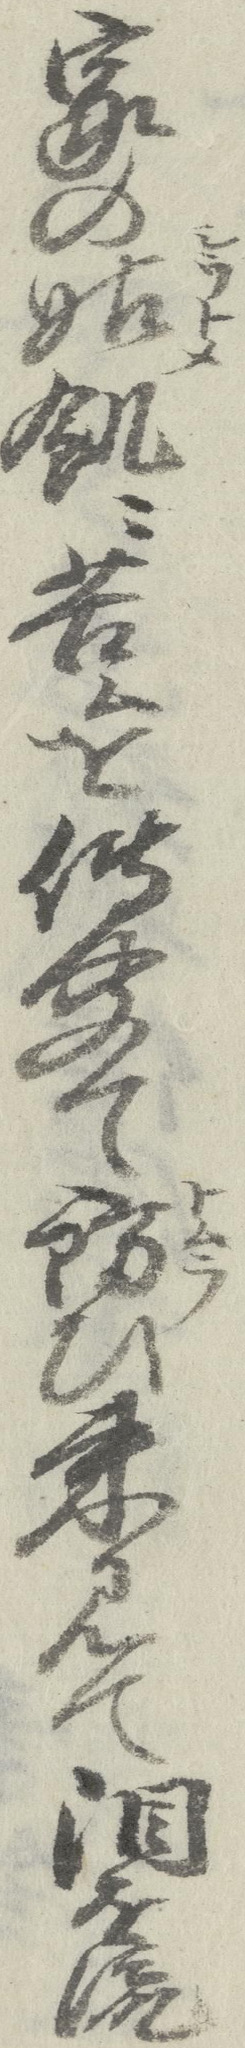家の姑飢に苦傳聞て防ひ来見て泪を流
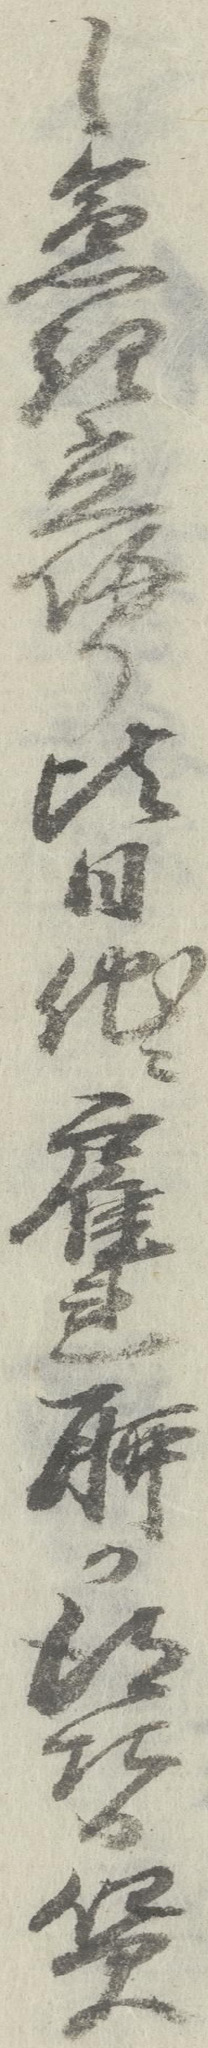し急き立帰り此日他に雇れ聊か得たる賃
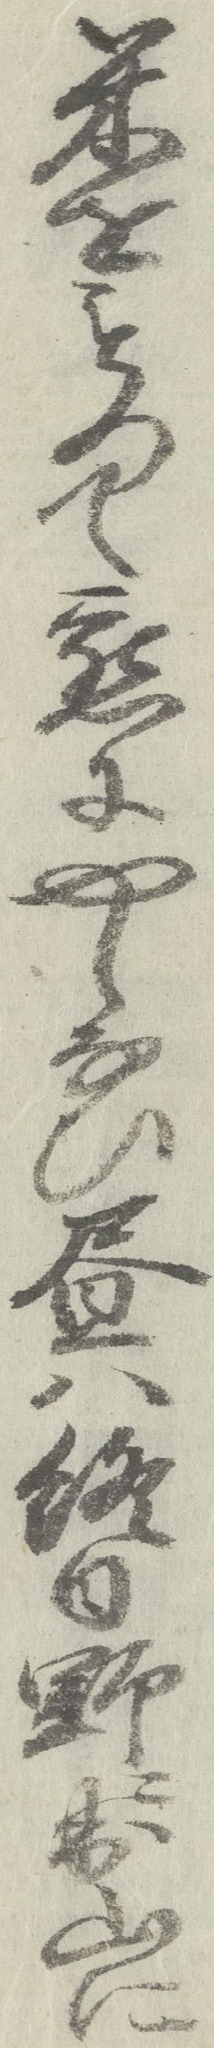米をもつて懇にやしなひ昼は終日野に出山に
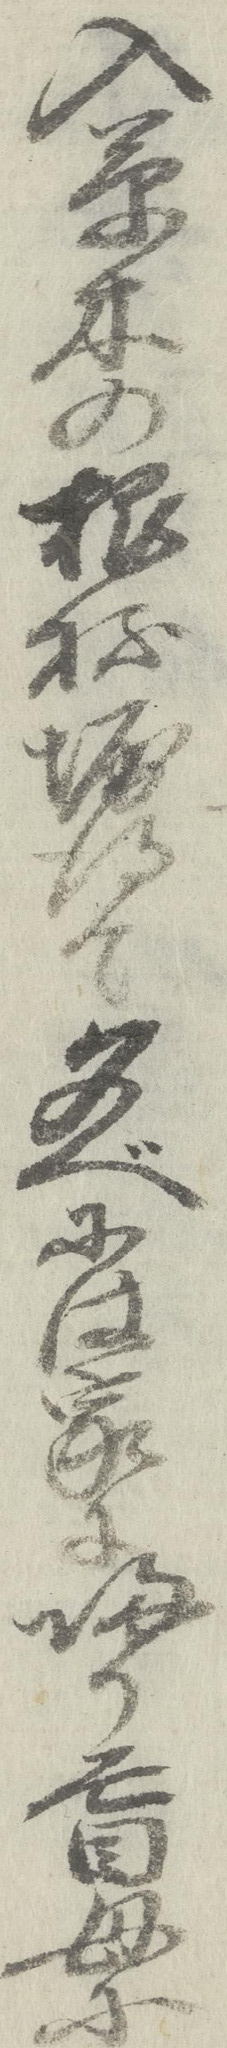入草木の根抔堀得て夕べには家に帰り盲母に
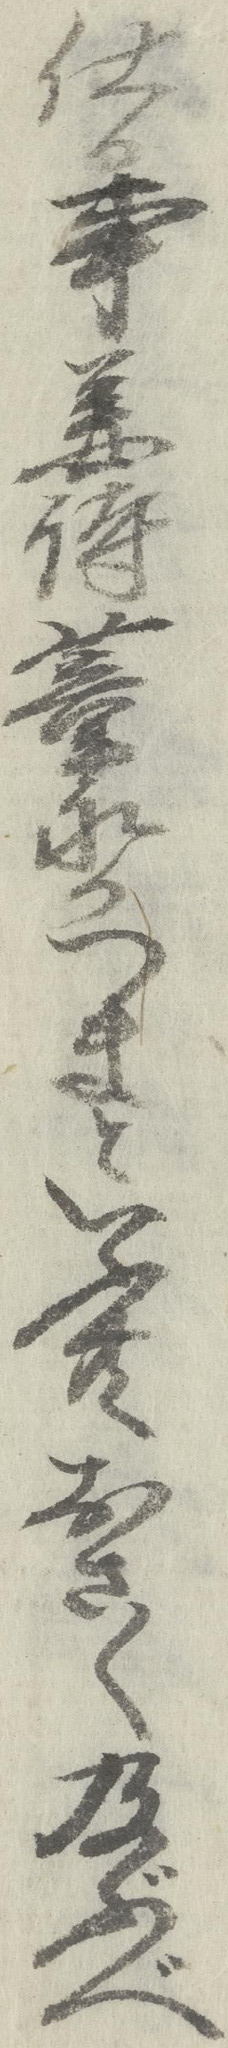仕る事妻侍董永かつまといふ共おさ〳〵及ぶべ
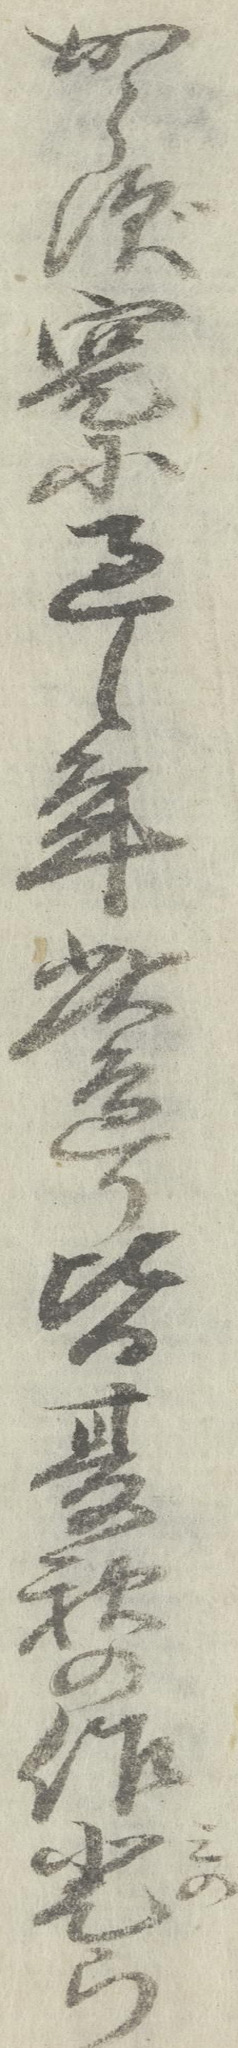からず寔に過し年此邊り皆夏秋の作登ら
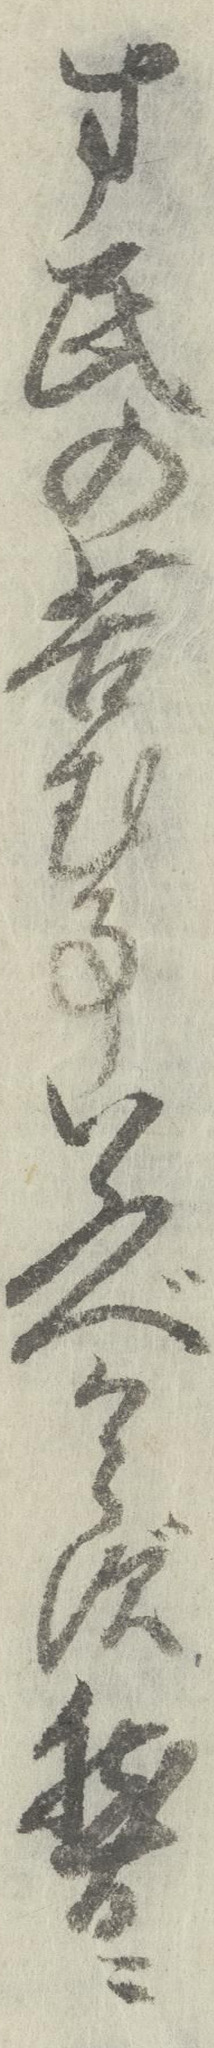す民の苦む事いふべからず然るに
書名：浅間大焼騒動記　下
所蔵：東京大学地震研究所図書室 Earthquake Research Institute Library, The University of Tokyo, JAPAN
